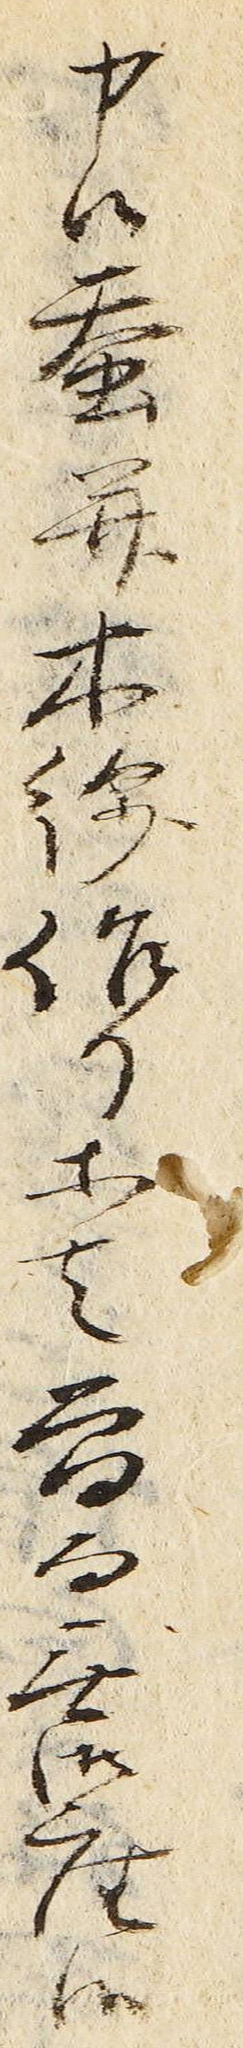申候蚕并木綿作り等は曽て無御座候
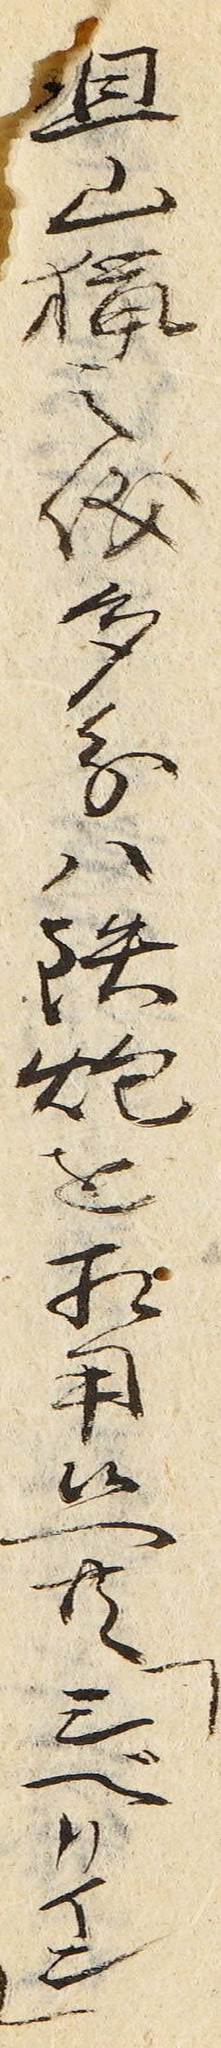且山猟之儀多分は鉄炮を相用候へ共「シベリイン」
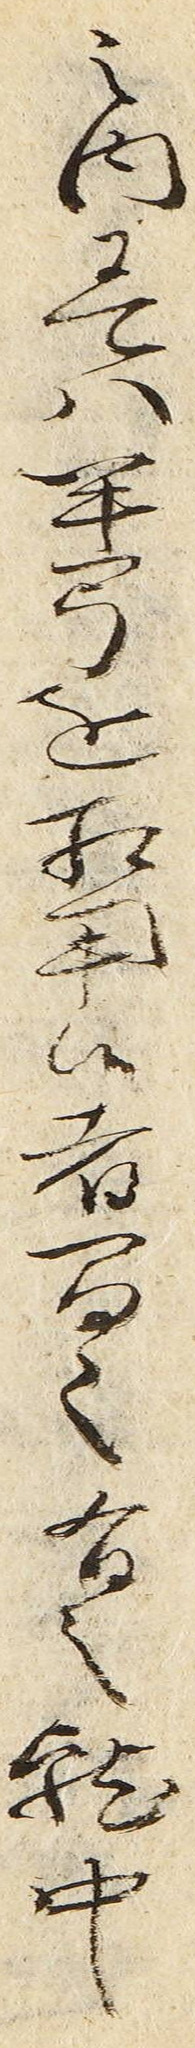之内にては半弓を相用候者間々有之就中
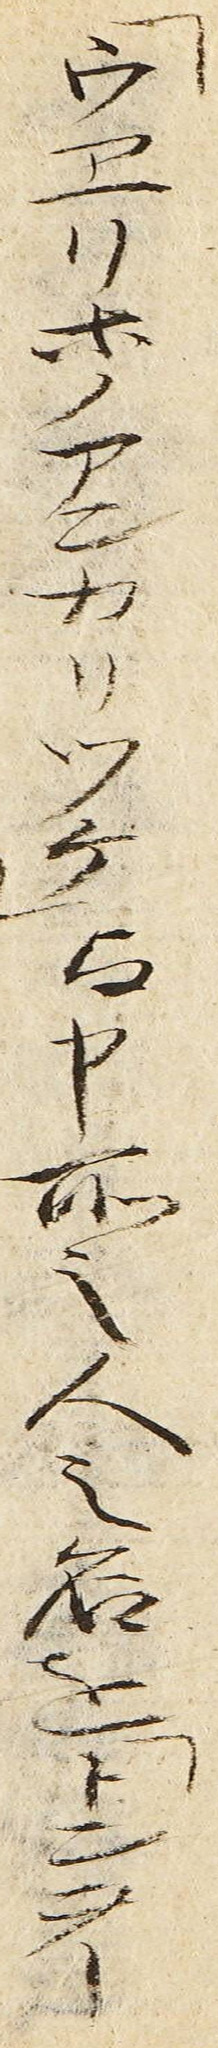「ウヱリホノアンカリツケ」と申所之人之名を「トンヲー
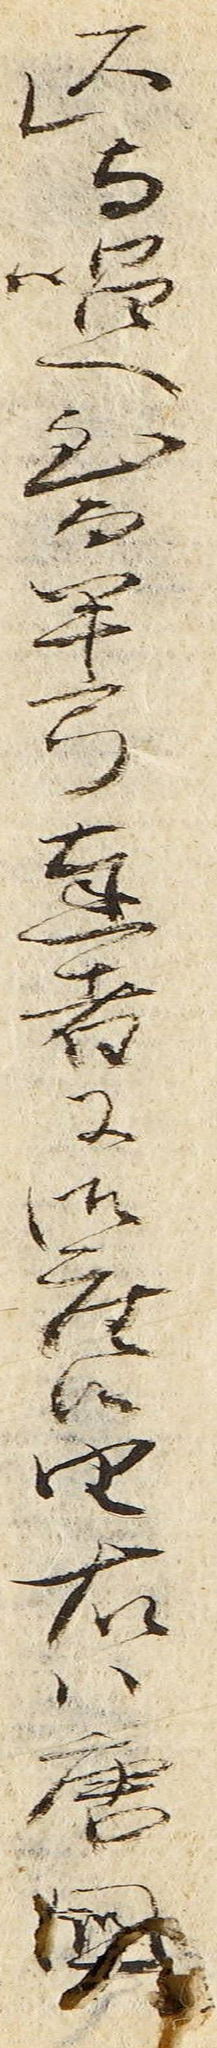ス」と唱へ至て半弓達者に御座候由右は唐国
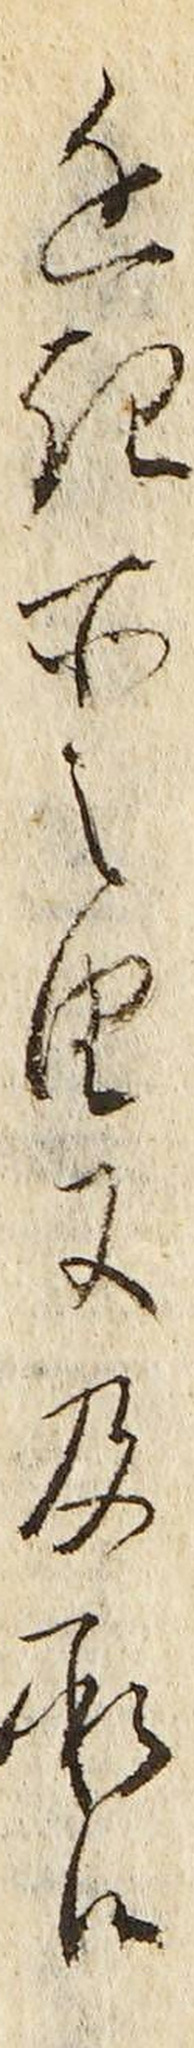近き所之由に及承候
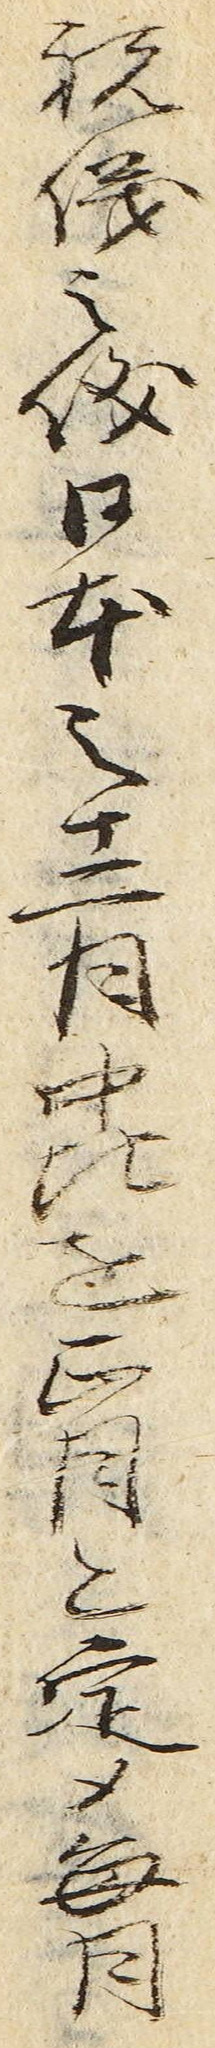祝儀之儀日本之十二月中比を正月と定メ毎月
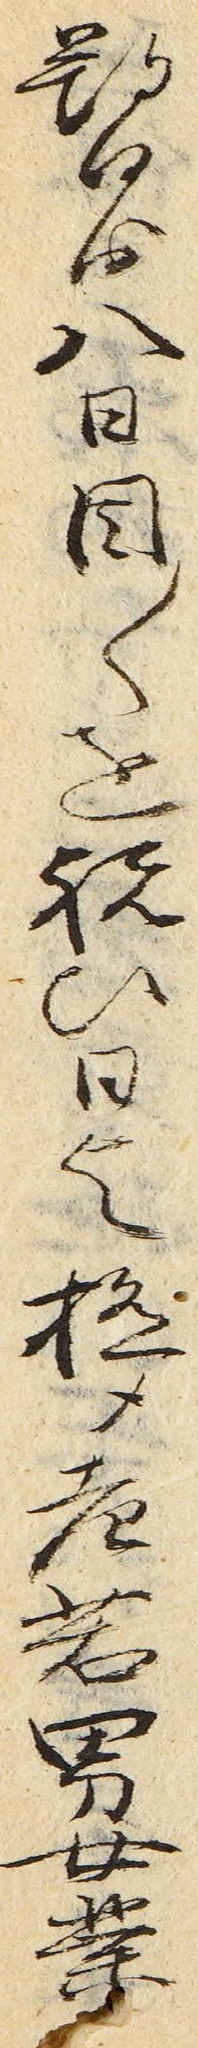朔日ゟ八日目〳〵を祝ひ日と極メ老若男女業

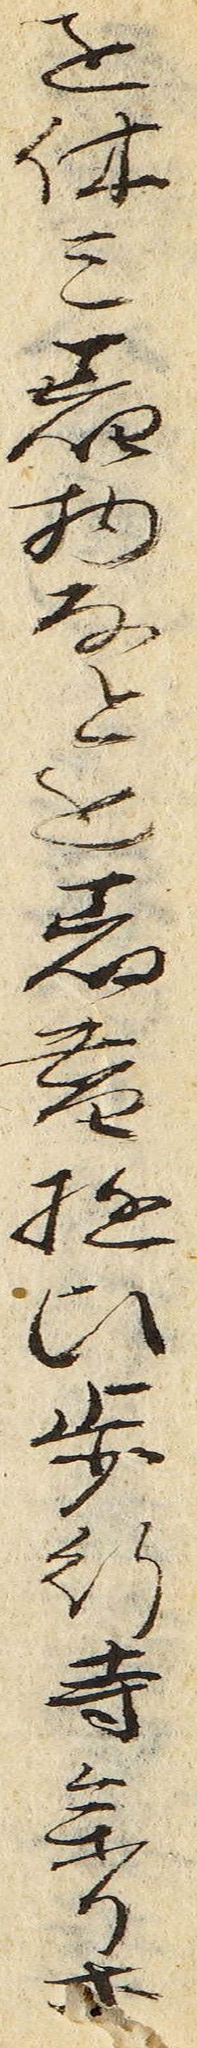を休み着物なとを着暮遊ひ歩行寺参り等
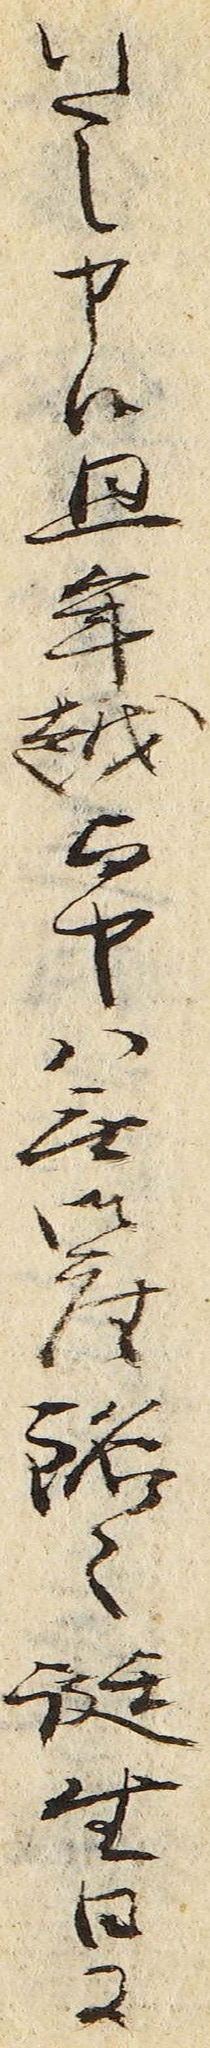いたし申候且年越と申は無御座銘々誕生日に
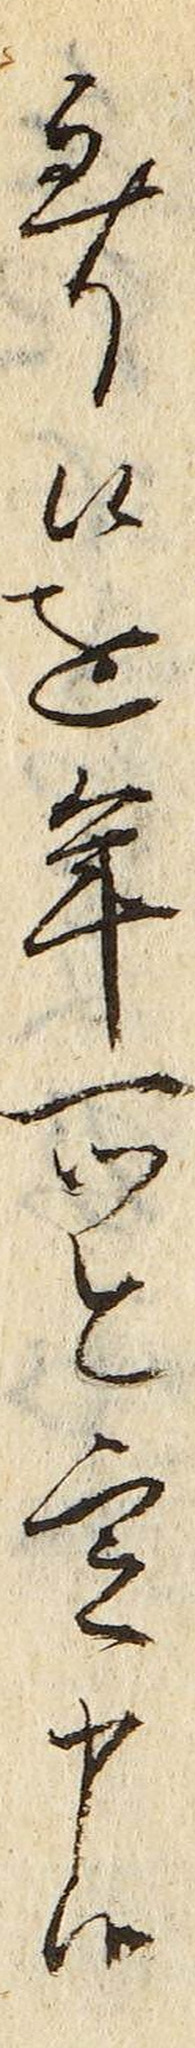至り候を年一ツと定申候
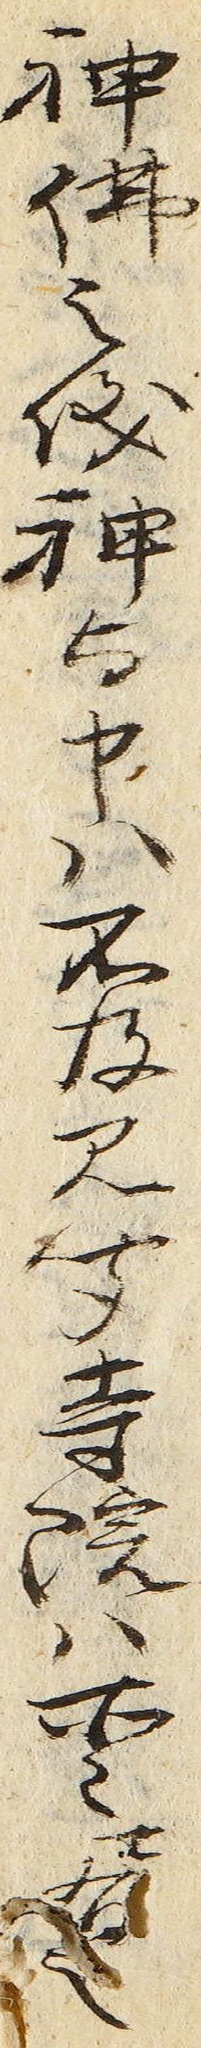神仏之儀神と申は不及見聞寺院は所々に有之
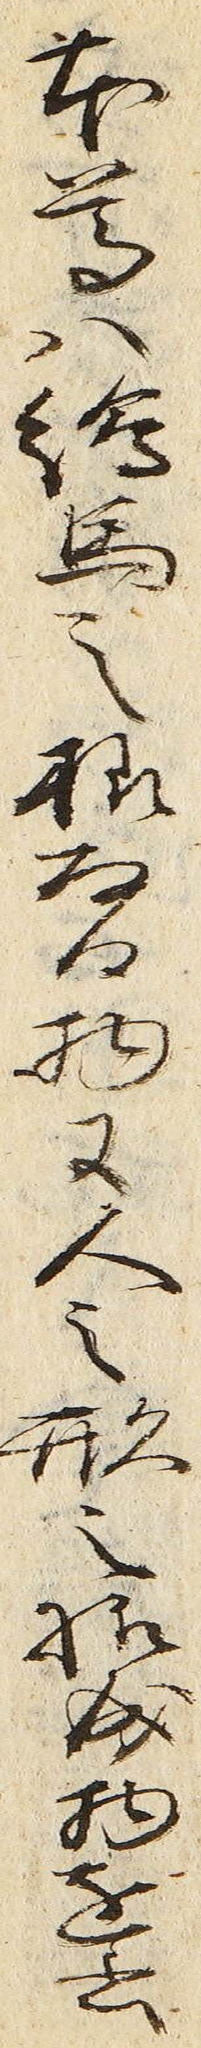本尊は絵馬之様なる物に人之形之様成物を書
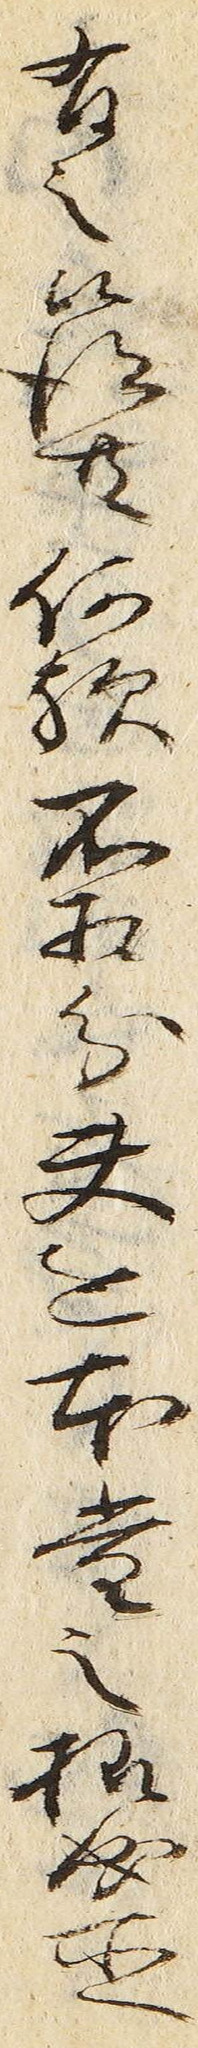有之候得共何歟不相分夫を本堂之様成所へ
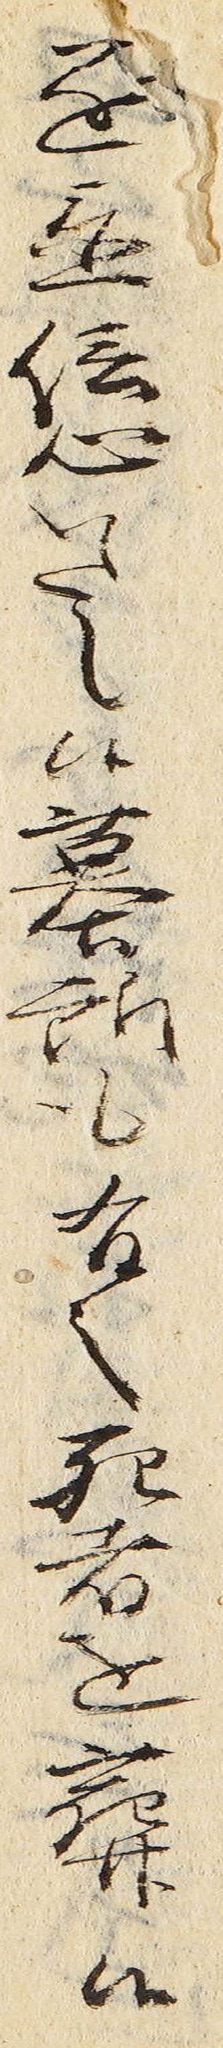懸置信心いたし候墓所も有之死者を葬候
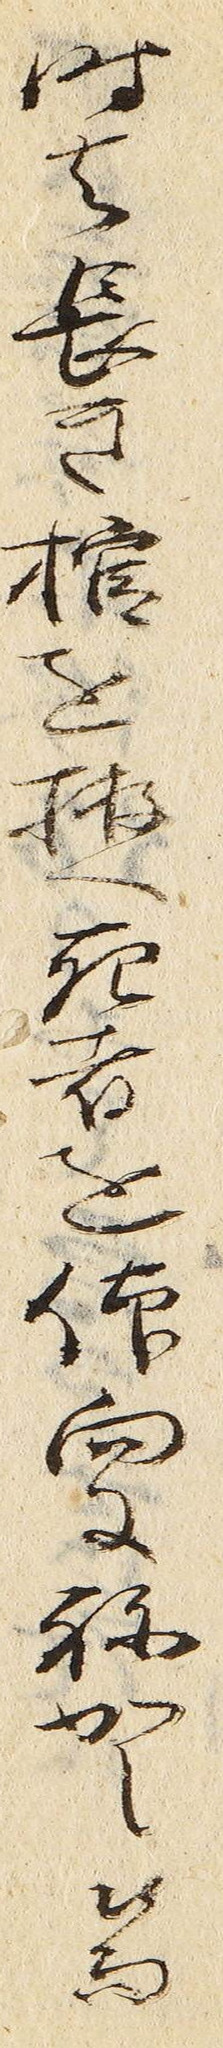時は長き棺を拵へ死者を仰向にねかし候て
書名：漂民後記
